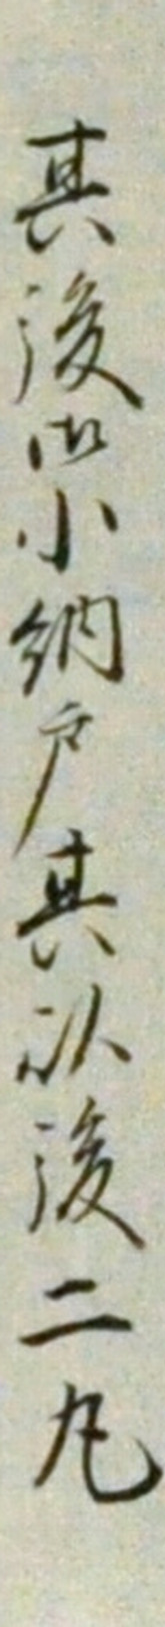其後御小納戸其以後二丸
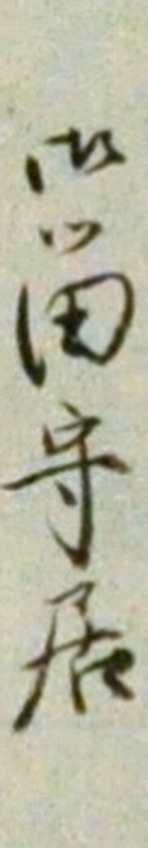御留守居
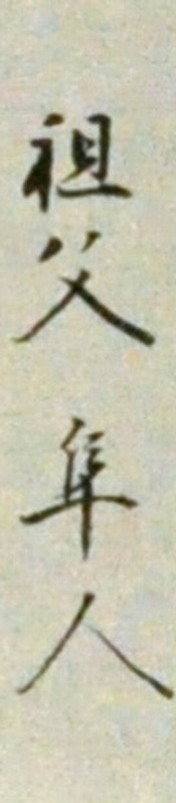祖父隼人
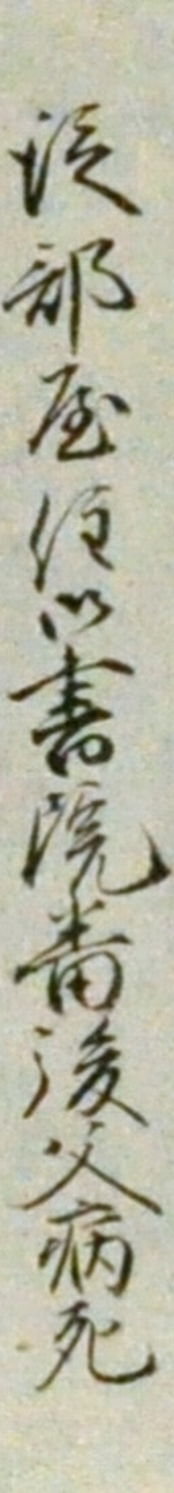従部屋住御書院番後父病死
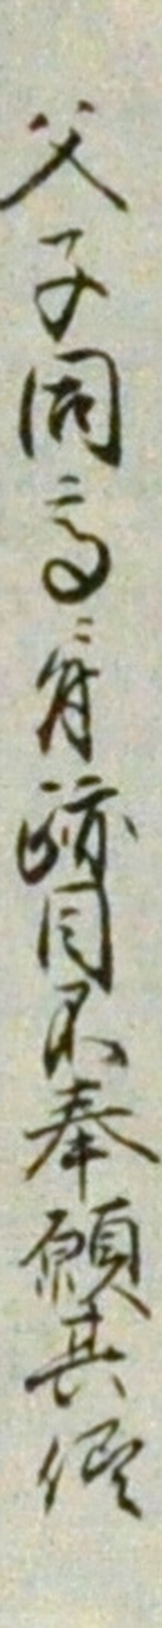父子同高に付跡目不奉願其侭
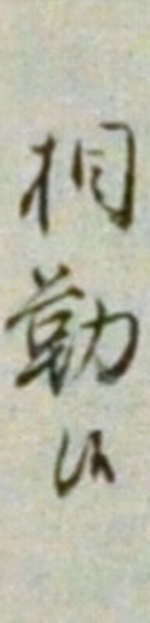相勤候
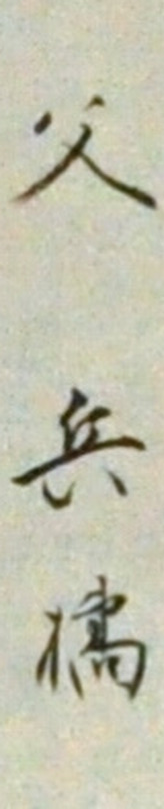父兵橘
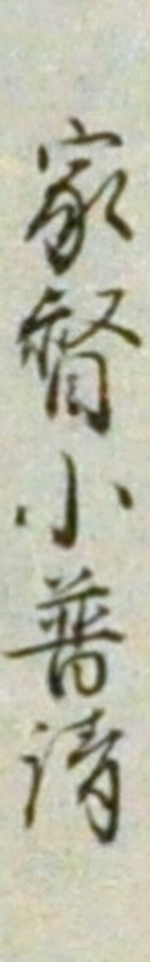家督小普請
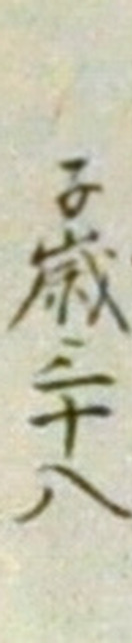子歳四十五
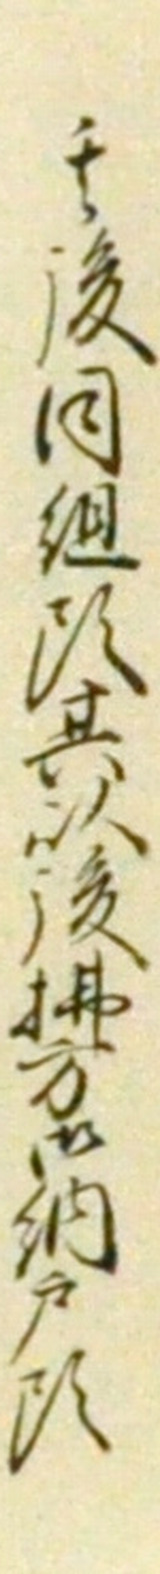其後同組頭其以後払方御納戸頭
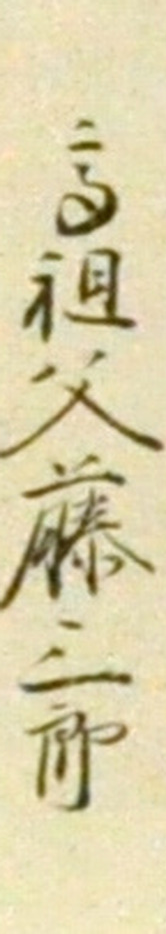高祖父藤三郎
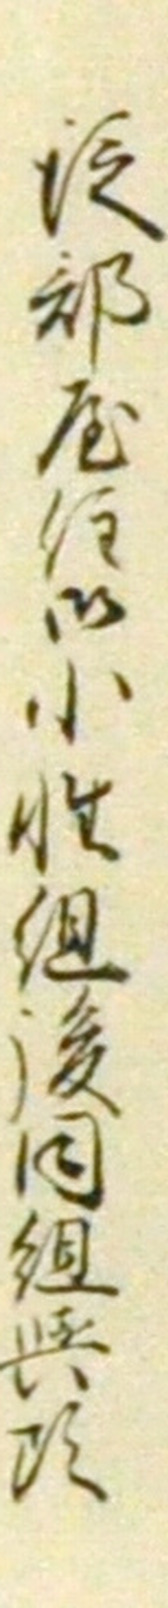従部屋住御小姓組後同組與頭
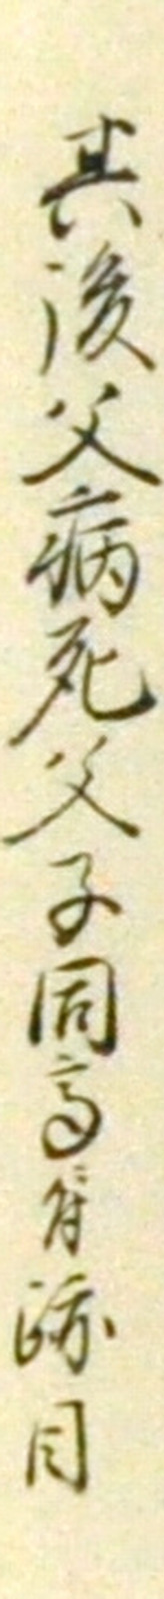其後父病死父子同高ニ付跡目

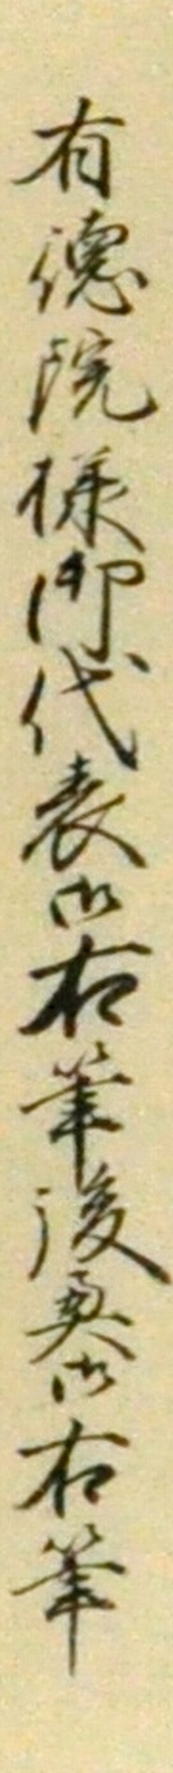有徳院様御代表御右筆後奥御右筆
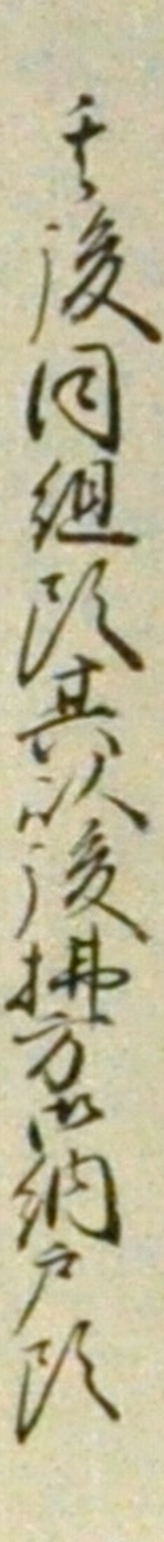其後同組頭其以後払方御納戸頭
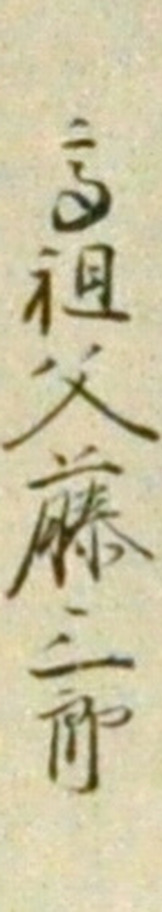高祖父藤三郎
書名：若年寄御役中御調書付
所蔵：伊那市立高遠町図書館・合同会社AMANE
